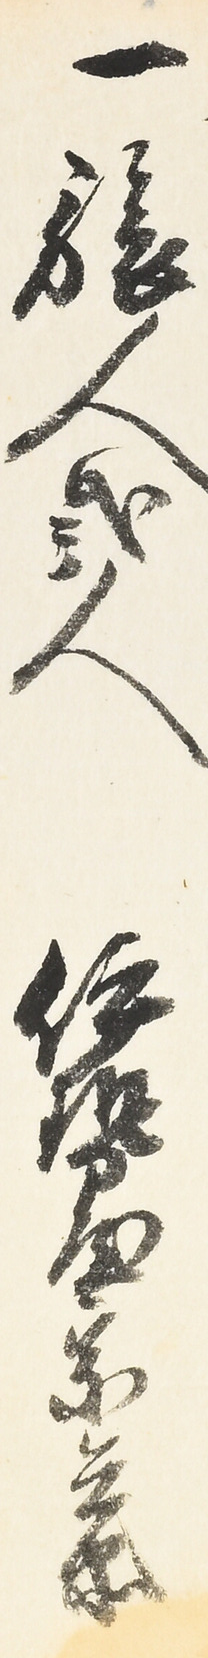一旅人弐人伊勢屋宗兵衛
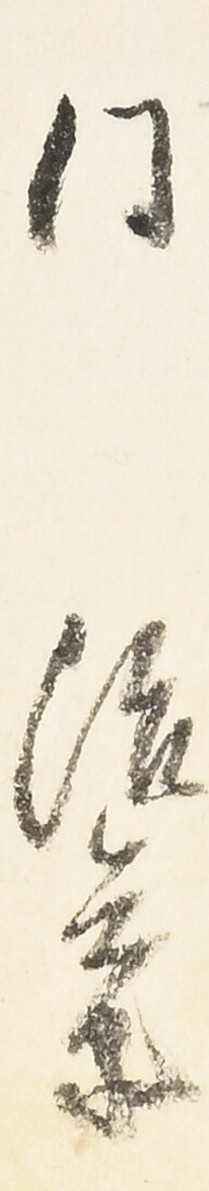同治兵衛
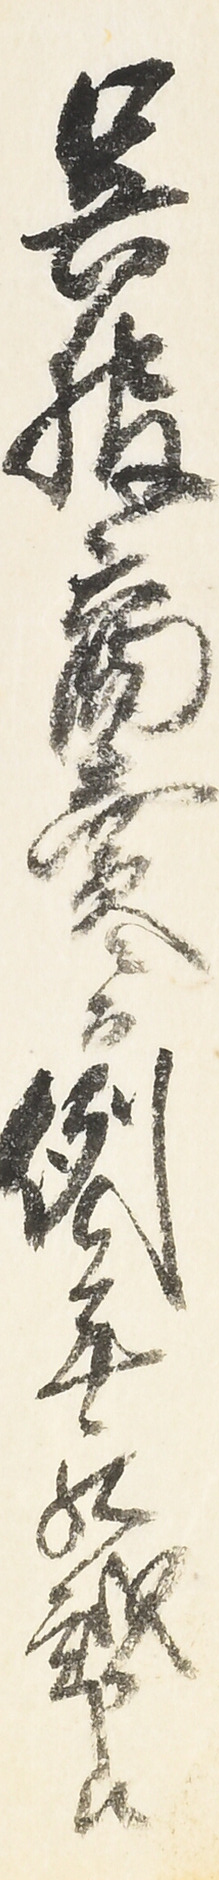呉服商売ニ而例年罷越申候
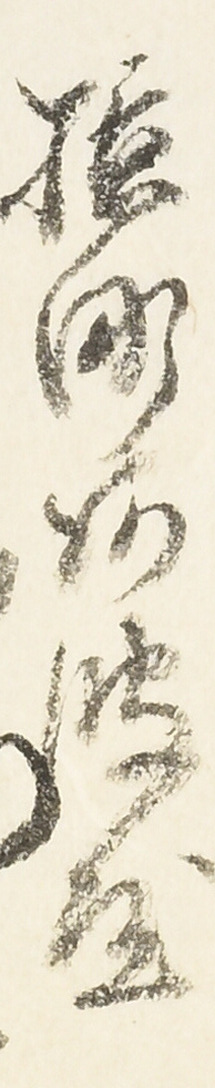横町阿波屋
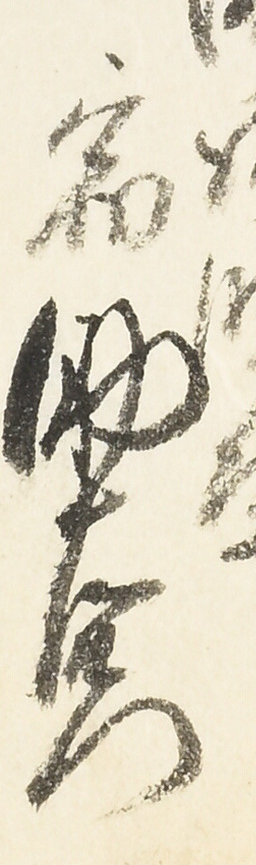宿助右衛門
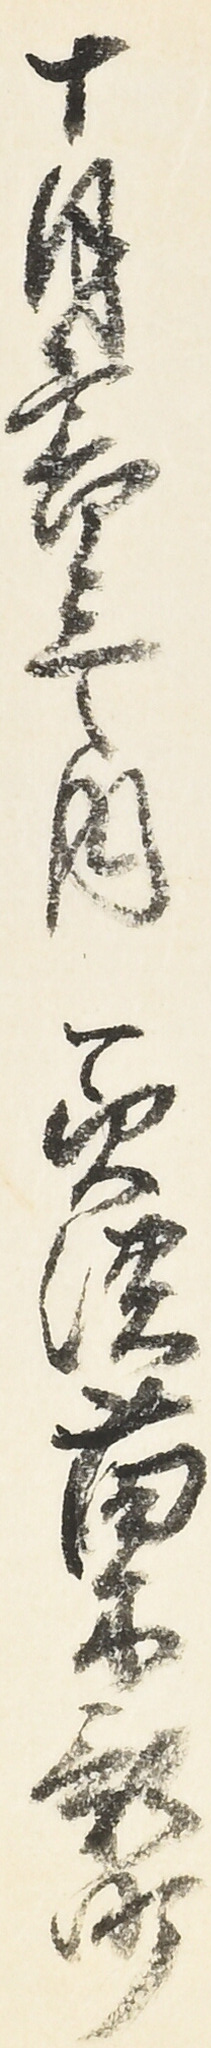十月書上之内美濃苗木新町
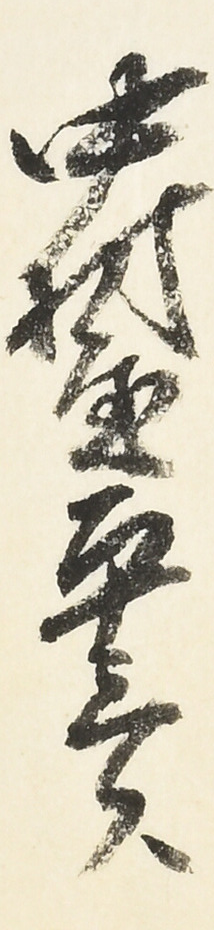一中村屋平三郎
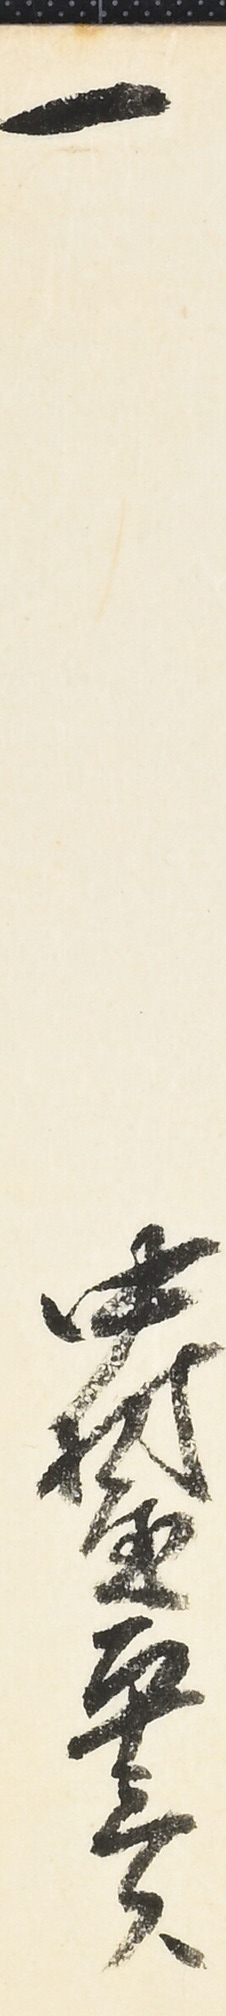一中村屋平三郎
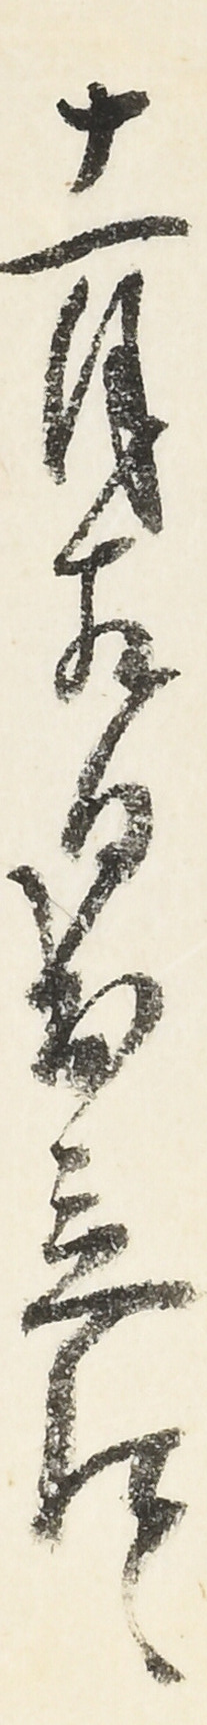十一月十九日出立仕候
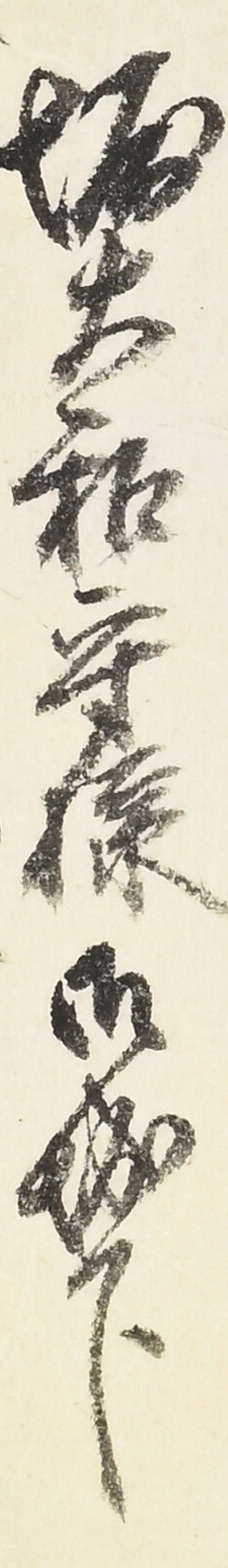堀大和守様御城下
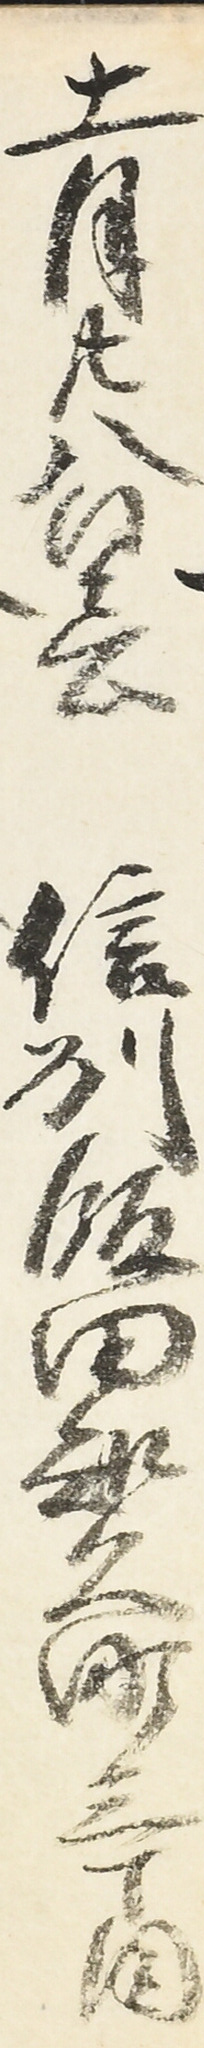十一月廿八日着信州飯田知久町三丁目
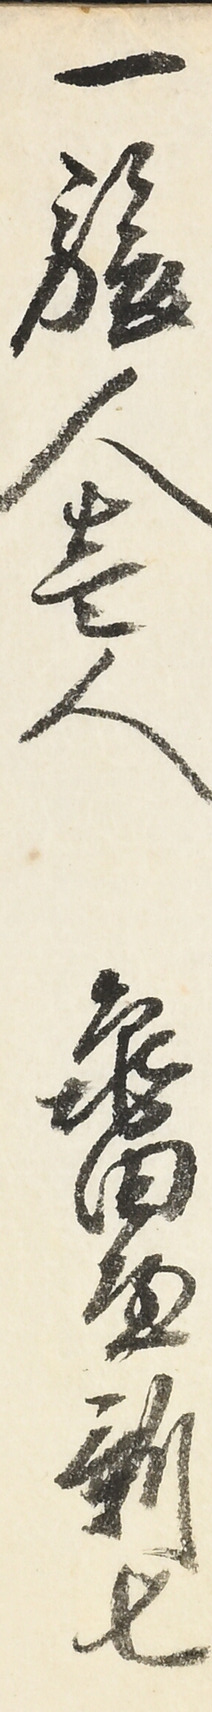一旅人壱人亀田屋新七
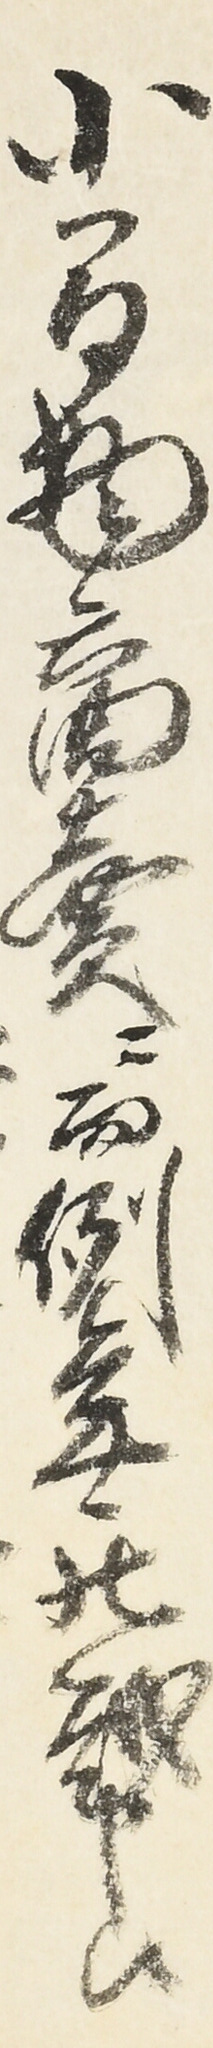小間物商売ニ而例年罷越申候
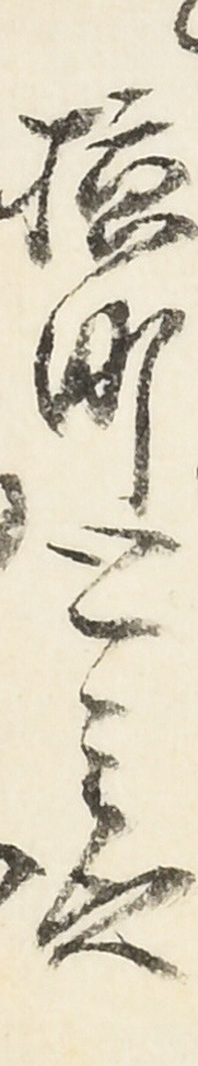横町とみや
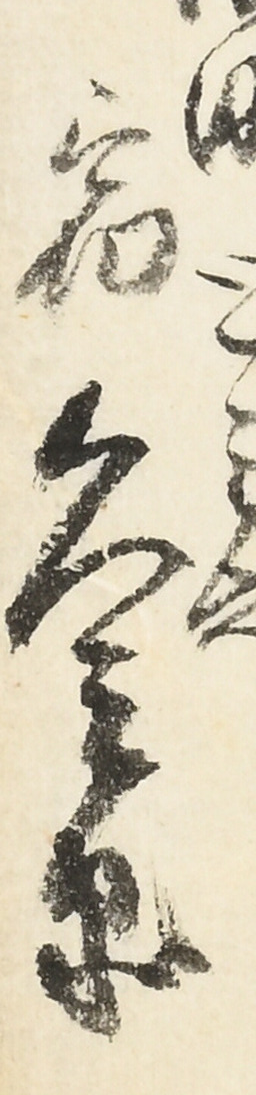宿久兵衛

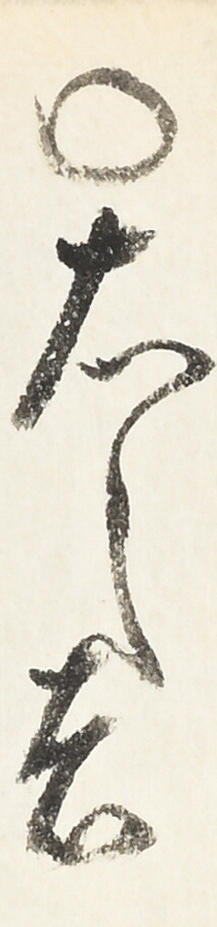〇右之者
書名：町中旅人泊控帳
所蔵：伊那市立高遠町図書館・合同会社AMANE
